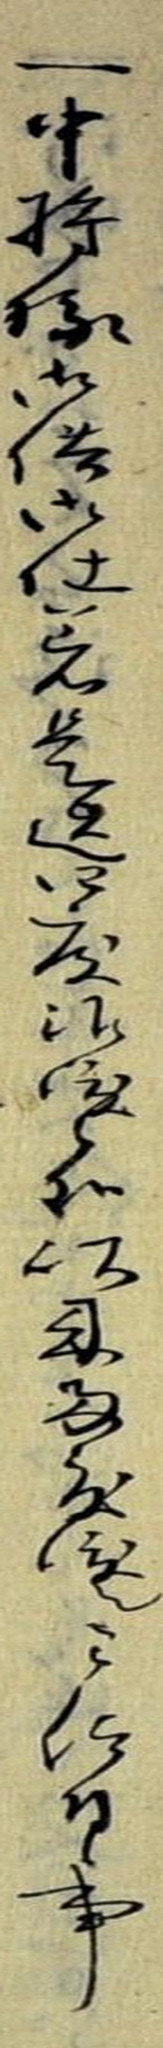一中将様御供御仕着是迄四度銀渡候処以来両度渡に被仰付候事
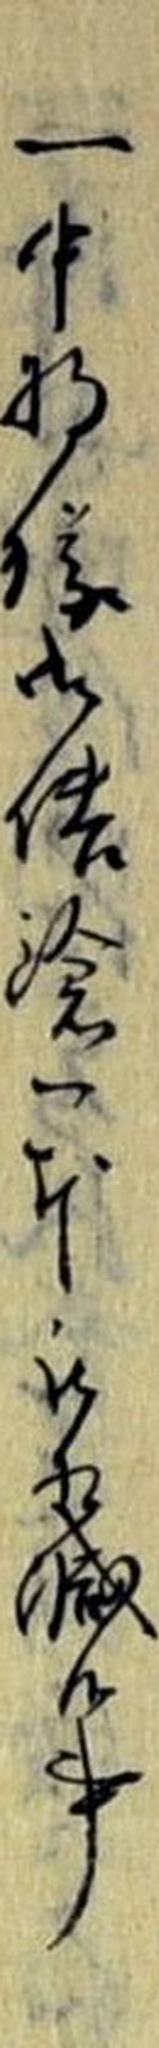一中将様御供鎗一本被相減候事
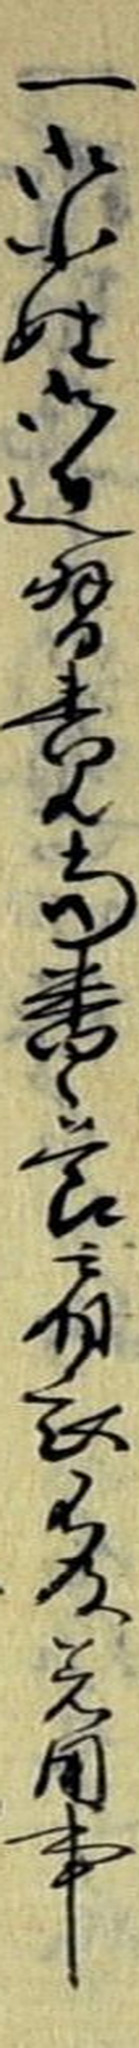一御小姓御近習番共当番之節肩衣不及着用事
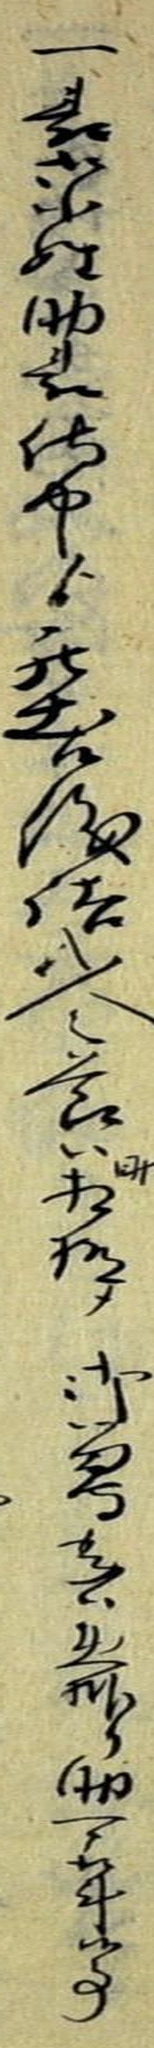一表御小姓助共侍中ゟ罷出候儀詰弐人之節は助相極メ御留守年は惣掛り助可取斗候事
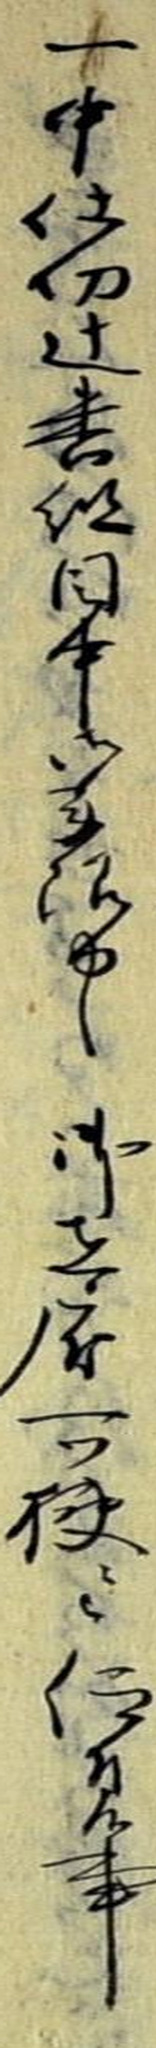一中仕切辻番組目付御年限中御在府一ッ紋に被仰付候事
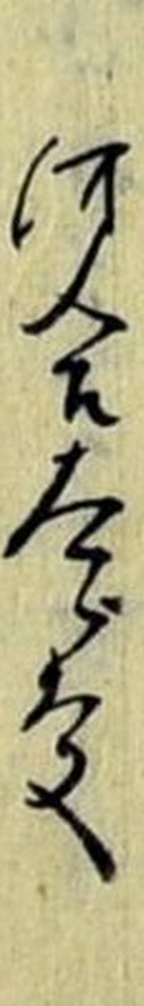河合太郎太夫
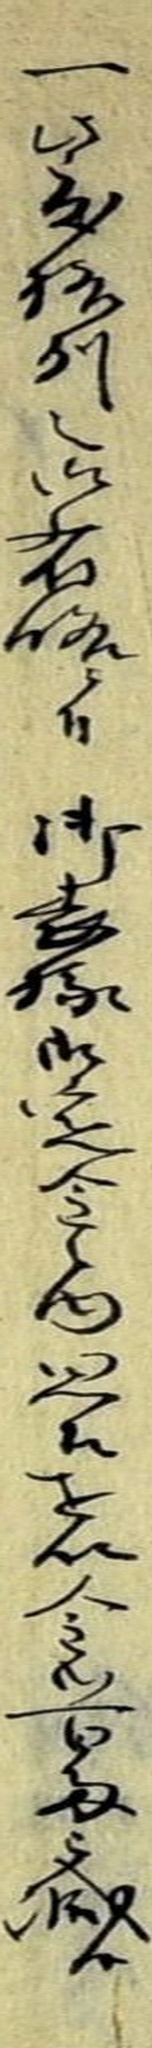一此度格別之御省略に付御表様御定金之内思召を以金弐百両被減候
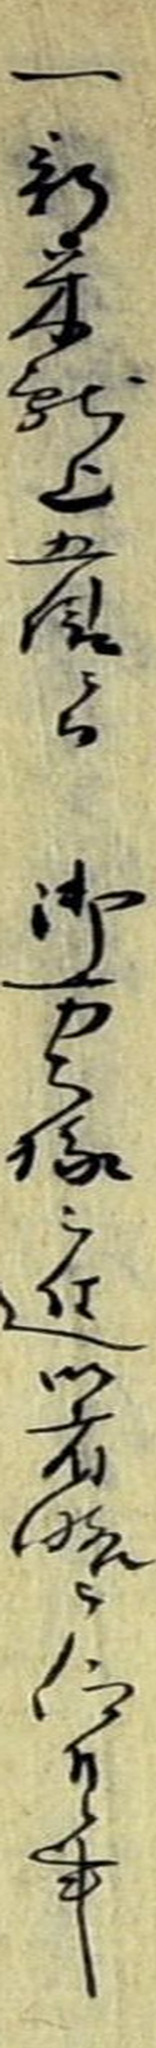一新米献上五供に而御方々様被進御省略被仰付候事
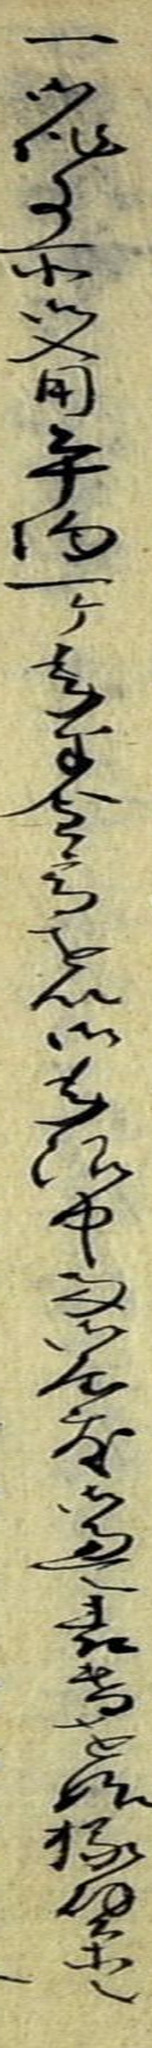一御作事所御入用平均一ヶ年半金高を以御年限中両御屋敷御畳表替を始縁壁等之
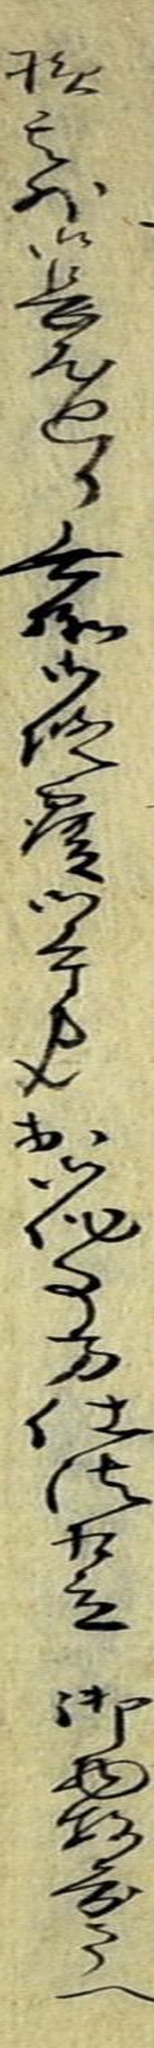損其外御長屋廻り無拠御修覆御寺方共於御作事方仕法相立御物数寄方へ
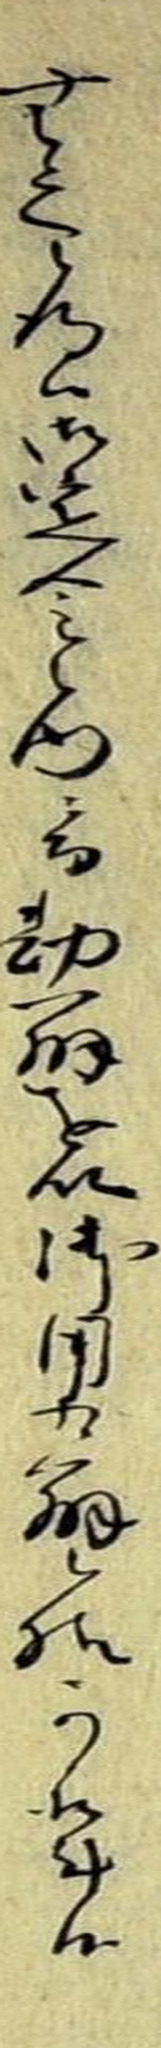無之候得は御定金之内に而勘弁を以御用相弁候様可取斗候
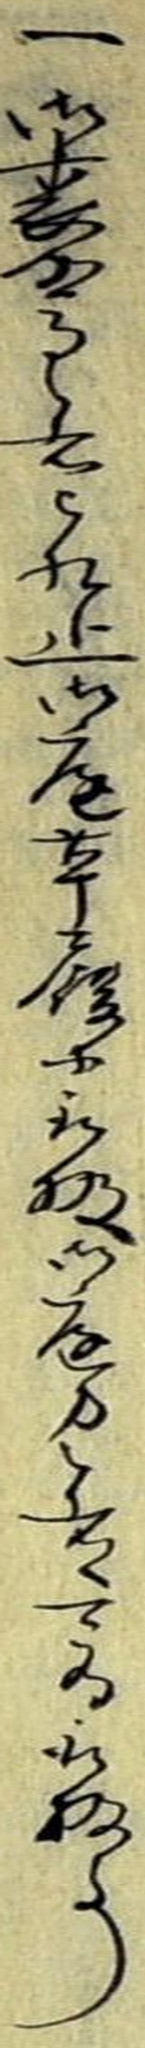一御裏駕之者被相止御庭草履等取扱御庭方之者へ可為取扱事

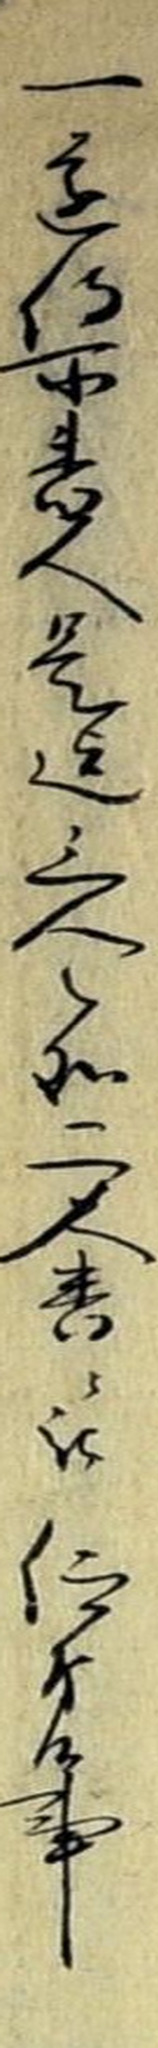一遠侍所番人是迄三人之処二人番に被仰付候事
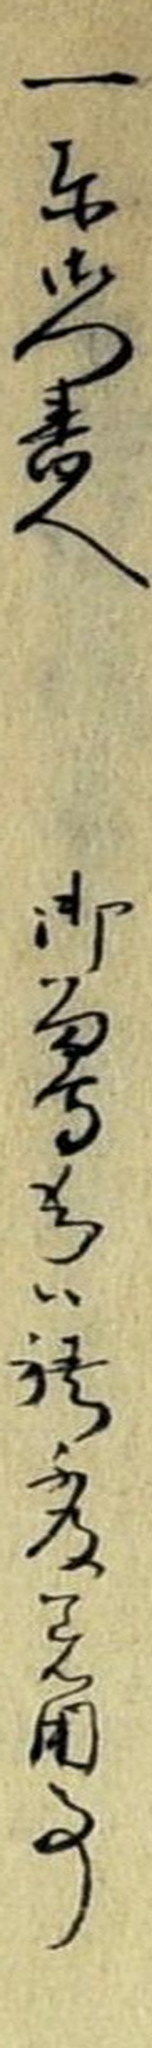一東御門番人御留守年は袴不及着用事
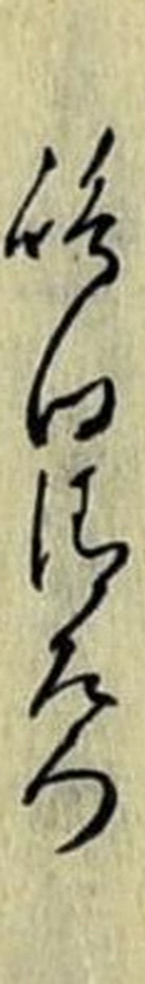嶋田清左衛門
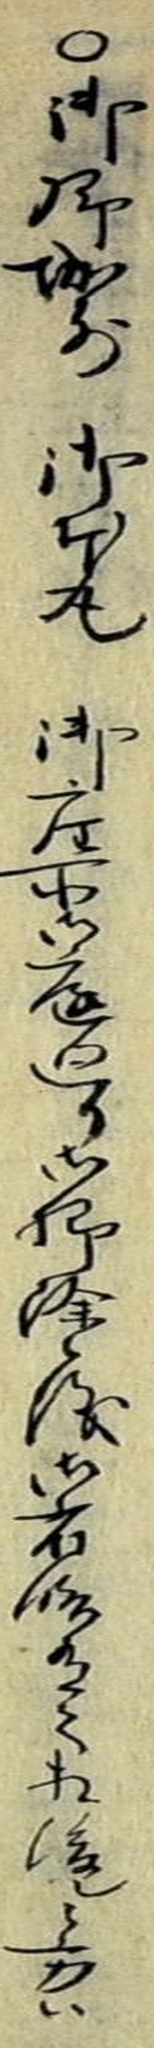○御帰城前御本丸御座所御庭廻り御掃除之儀御省略有之相後れ之方は
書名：命令之部 四
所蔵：福井県文書館 Fukui Prefectural Archives
